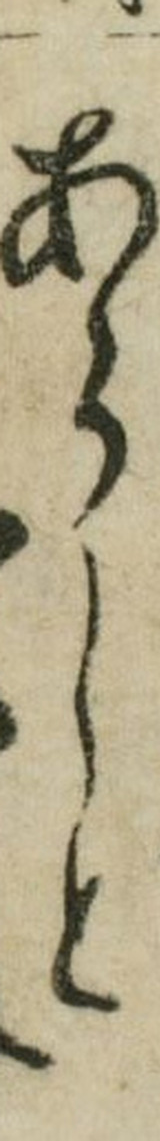あらしと
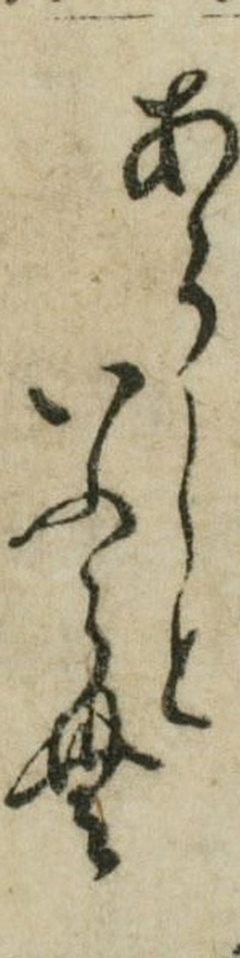いふらむ
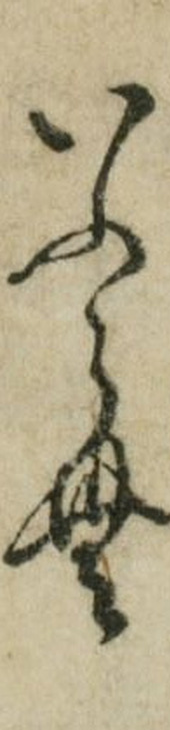いふらむ
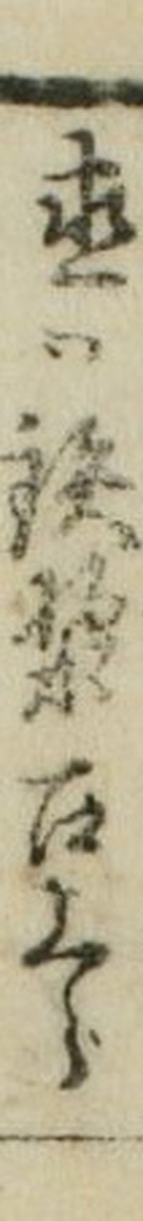直御鉄漿召上ら
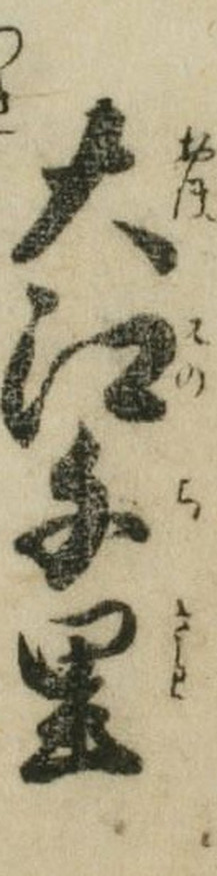大江千里
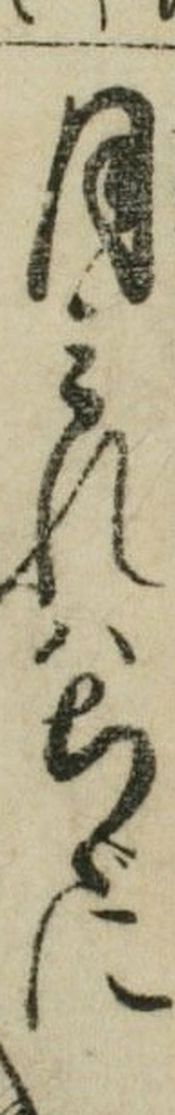月みれはちゞに
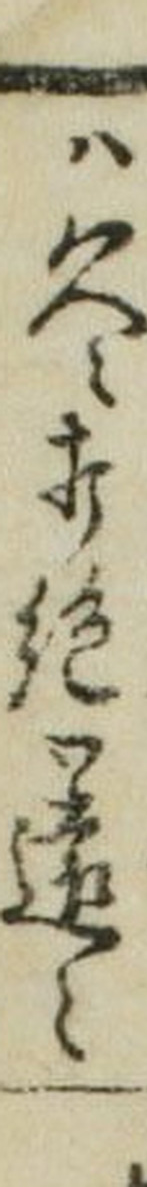は久々打絶御遠々
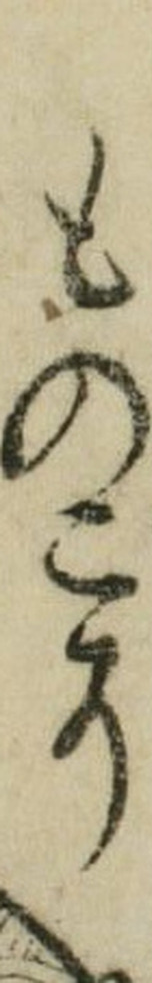ものこそ
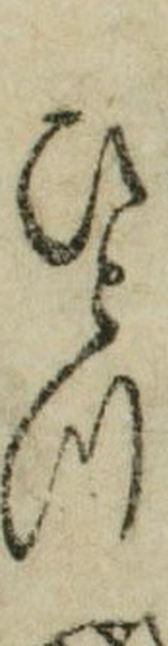ひとつ
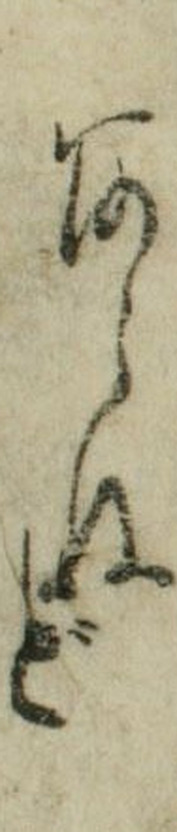あらねど

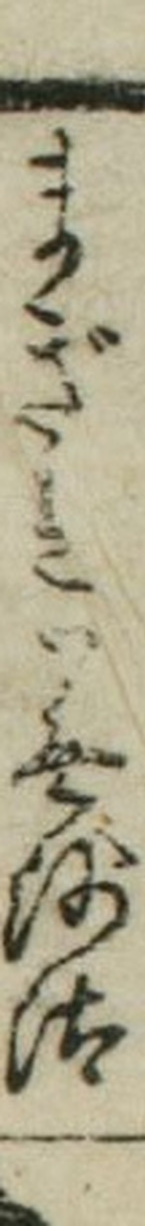まぎれ御無沙汰
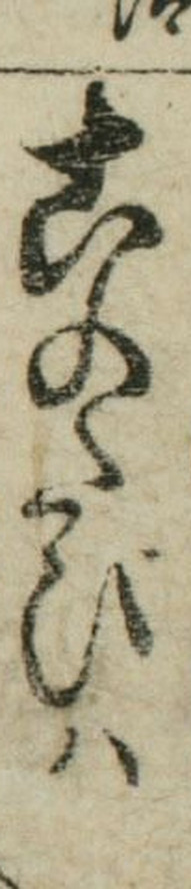このたびは
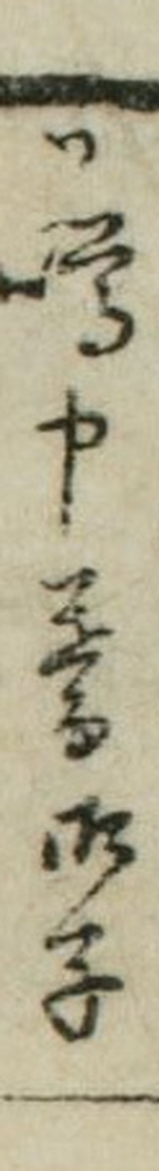御噂申暮御子
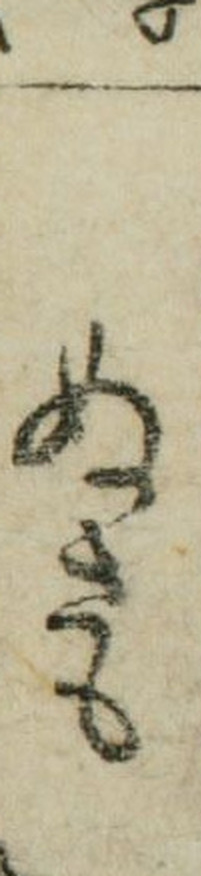ぬさも
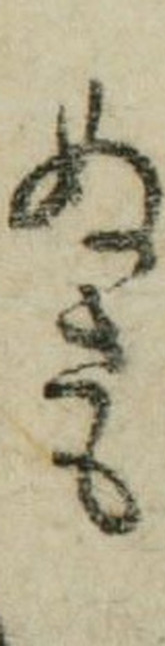ぬさも
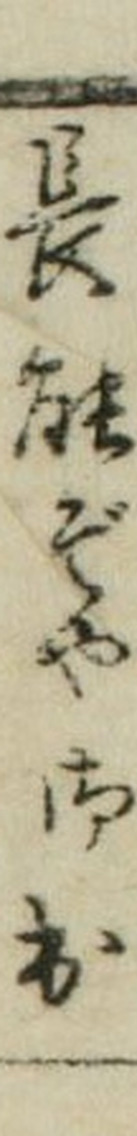長能ぞや御出
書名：百人一首
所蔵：東京学芸大学教育コンテンツアーカイブ
